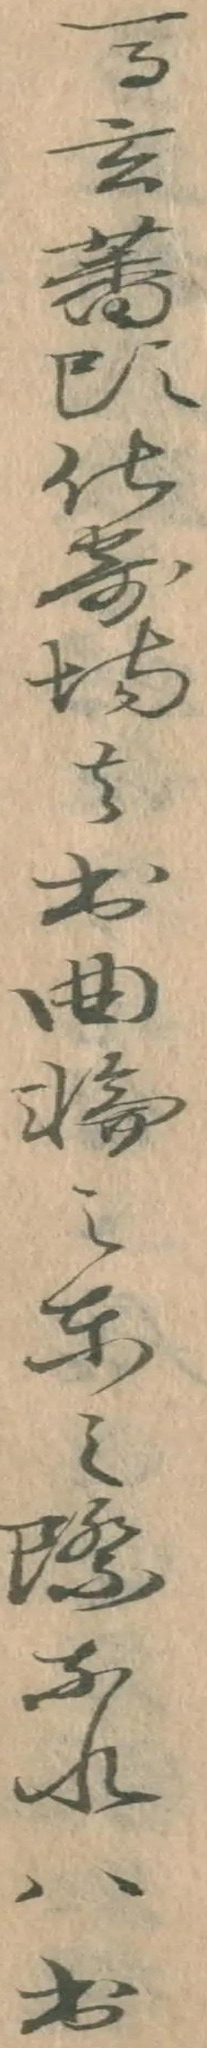馬玄蕃頭仕寄場者出曲輪之東之際なれは出
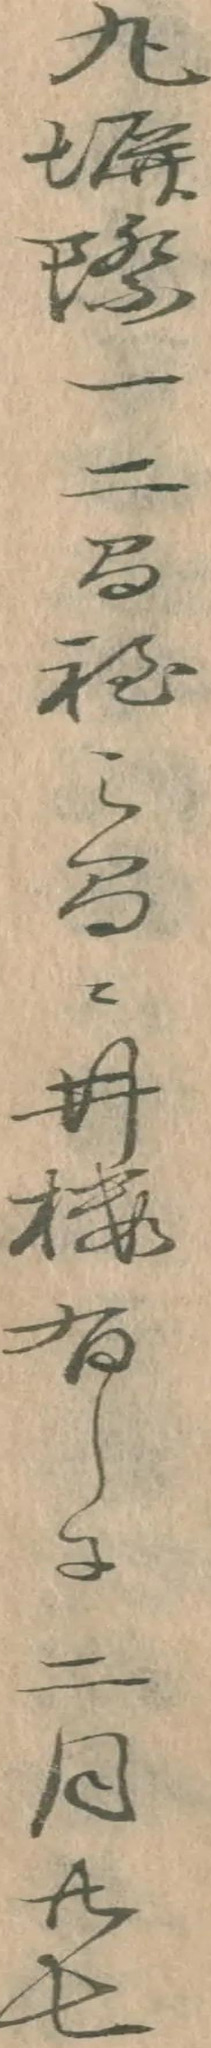丸塀際一二間程之間に井樓有し尓二月廿七
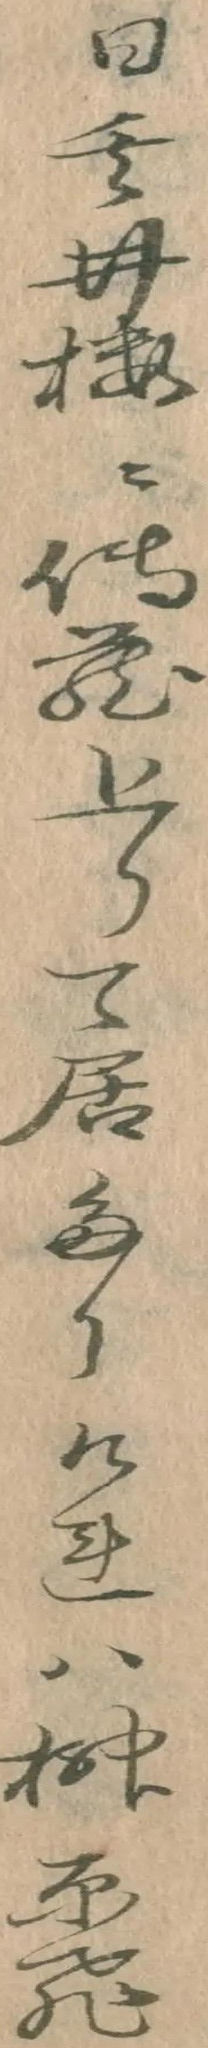日其井樓に伝蔵上りて居多りけ連は榊原飛
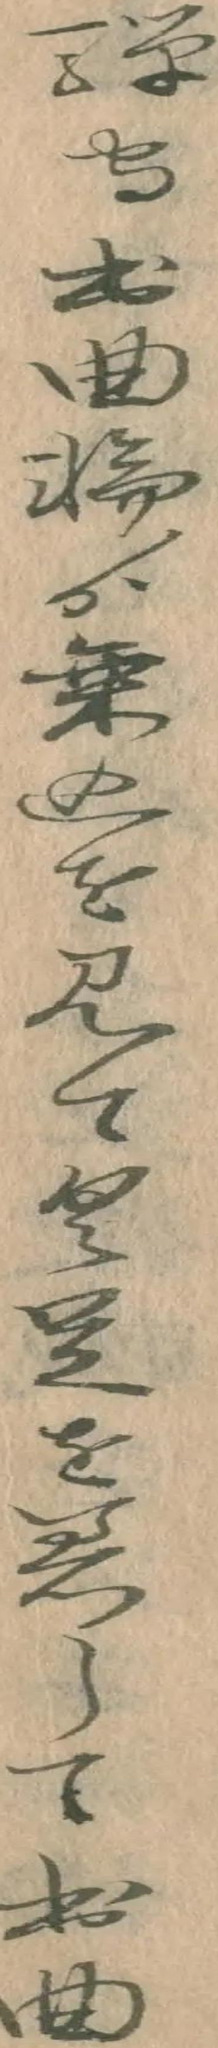騨守出曲輪ゟ乗込を見て具足を着して出曲
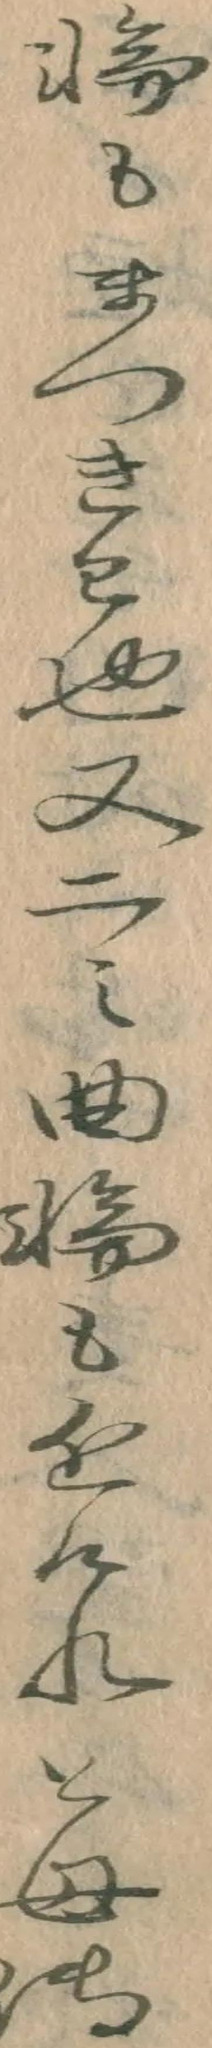輪もまつき己也又二之曲輪も近けれと母伝
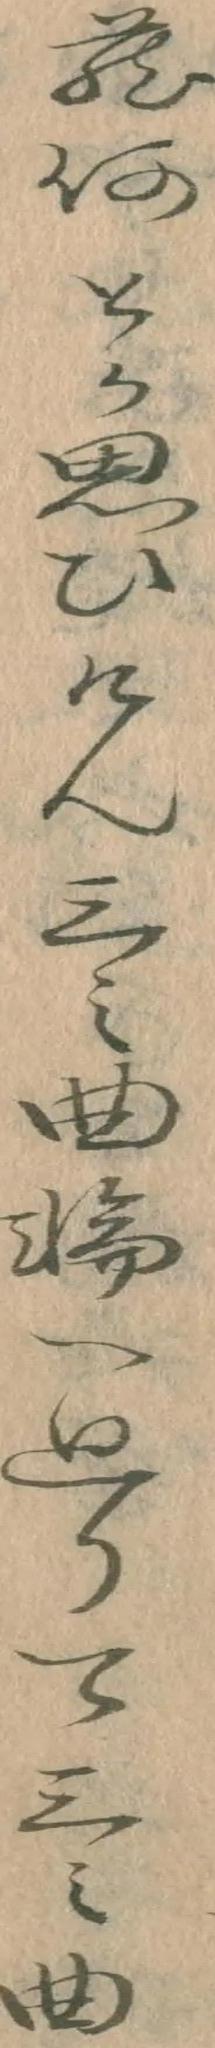蔵何とか思ひけん三之曲輪へ廻りて三之曲
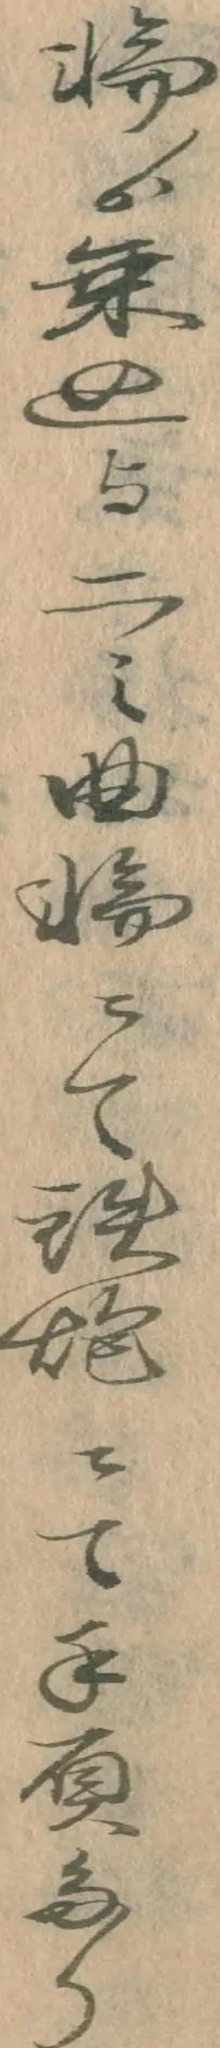輪ゟ乗込与二之曲輪にて鉄砲にて手負多り
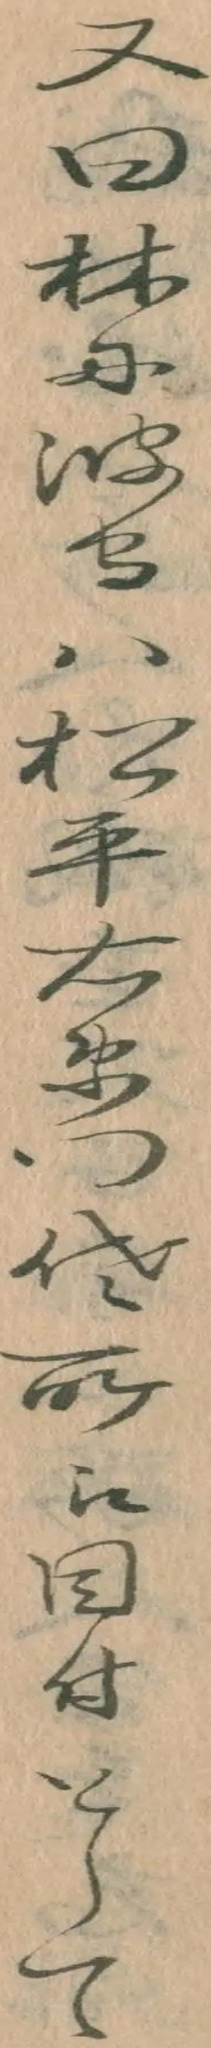又曰林丹波守は松平右衛門佐所江目付として
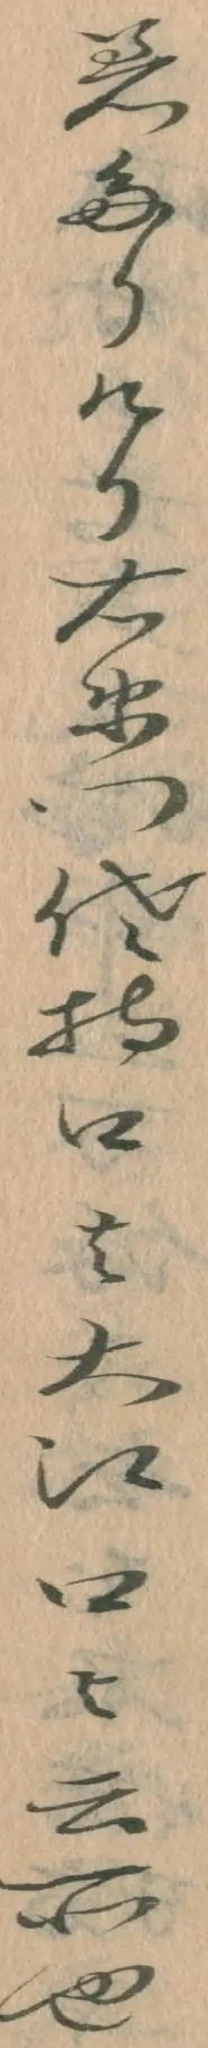着多りけり右衛門佐持口者大江口与云所也
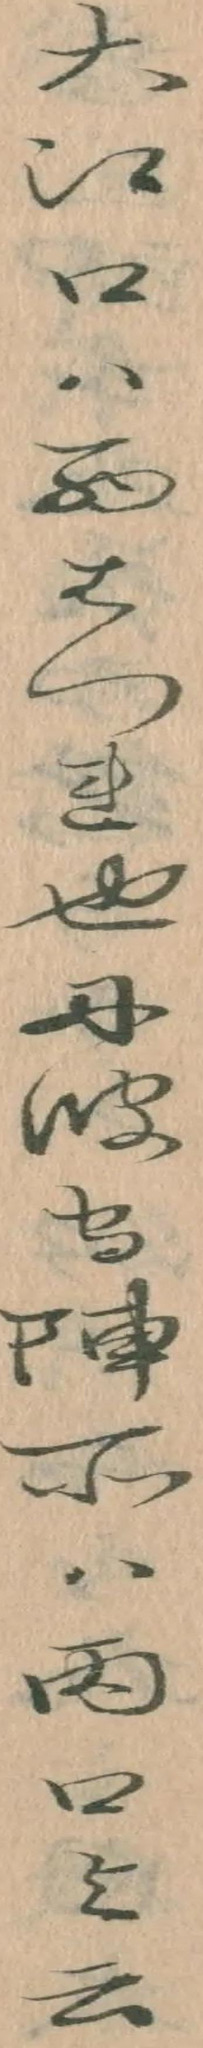大江口は西者つ連也丹波守陣所は丙口与云
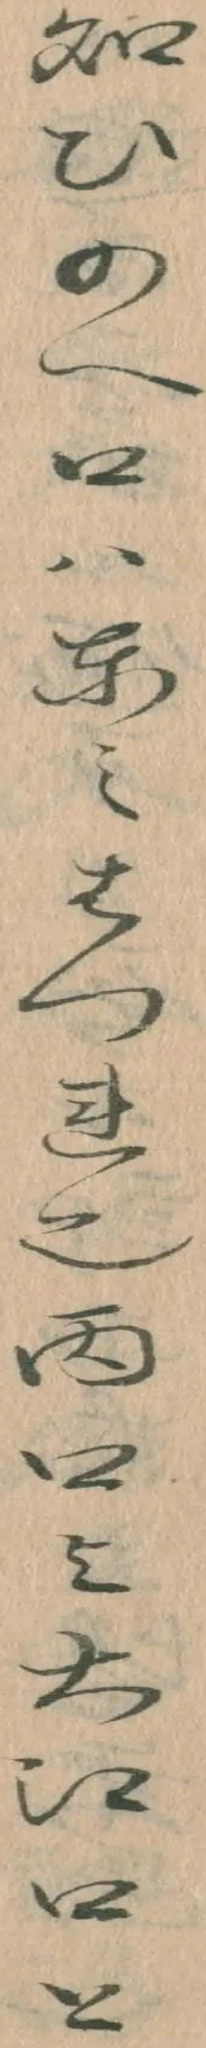処ひのへ口は東之者つ連也丙口与大江口と
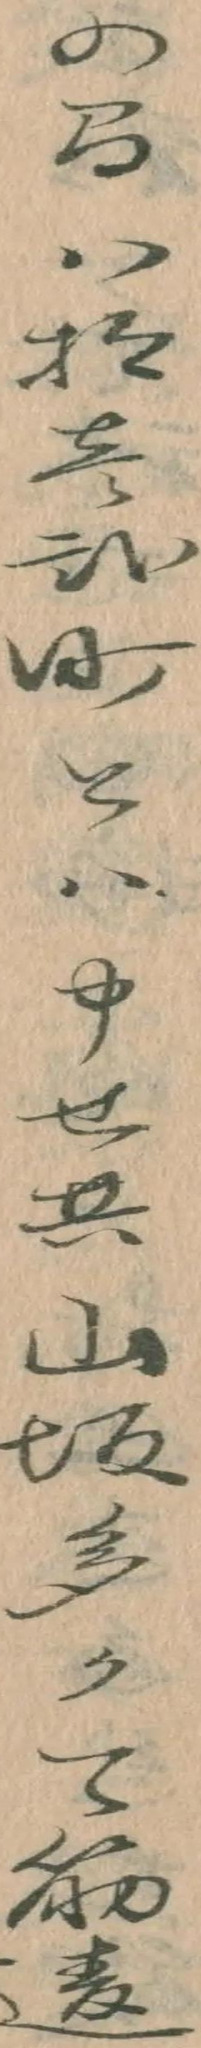の間は拾壱弐町とは申せ共山坂多くて筋違
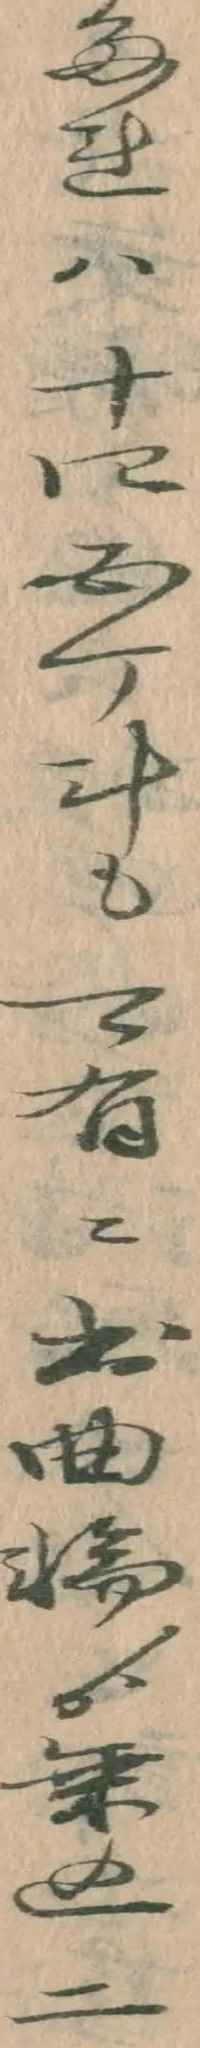多連は十四五丁斗も可有に出曲輪ゟ乗込二
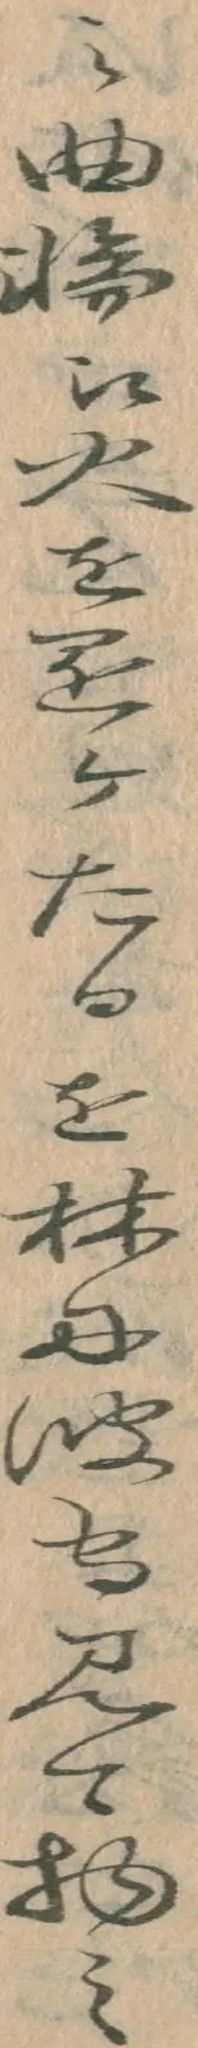之曲輪江火を懸けたるを林丹波守見て物之
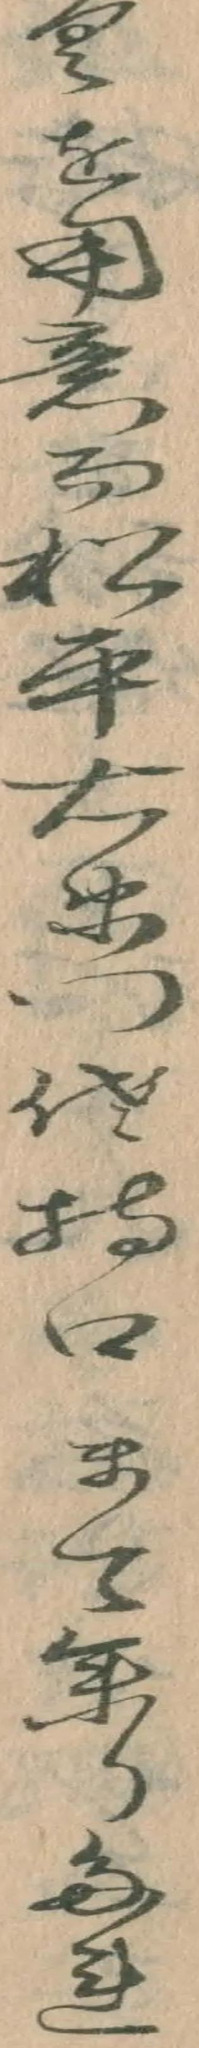具を用意而松平右衛門佐持口まて参り多連
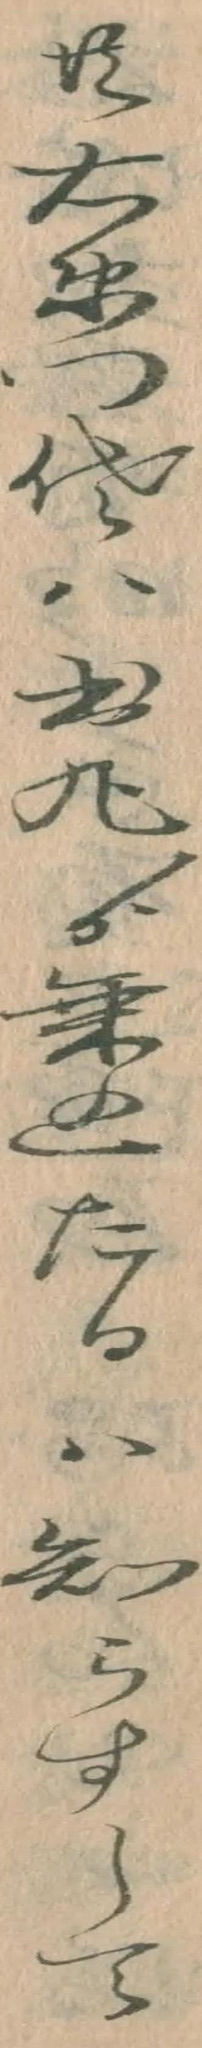共右衛門佐は出丸ゟ乗込たるは知らすして
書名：切支丹御退治記 49巻. [8]
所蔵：国立国会図書館 National Diet Library, JAPAN
